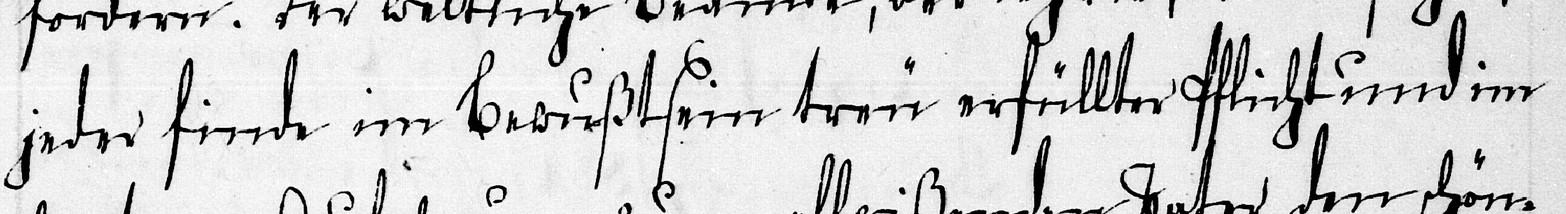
jeder finde im Bewußtsein treu erfüllter Pflicht und im
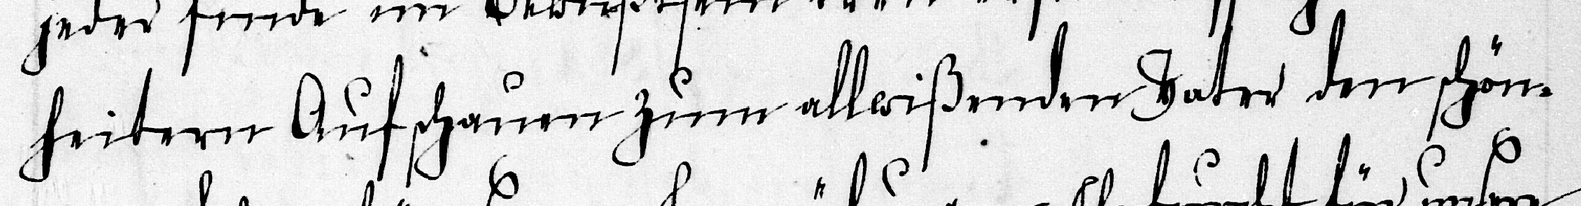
heitern Aufschauen zum allwißenden Vater den schön¬
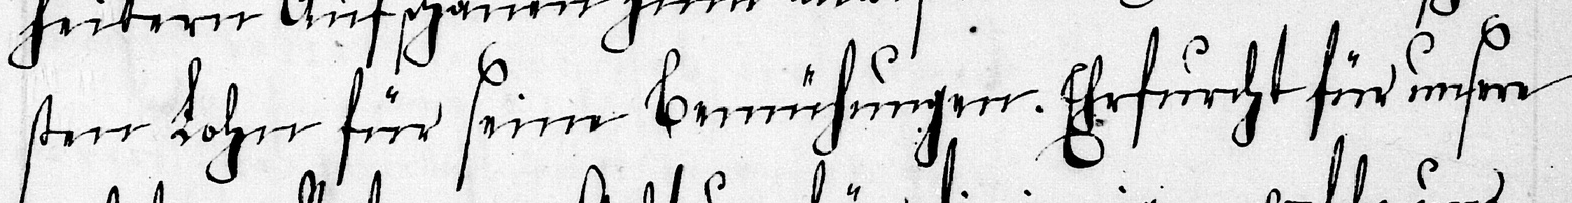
sten Lohn für seine Bemühungen. Ehrfurcht für unsere
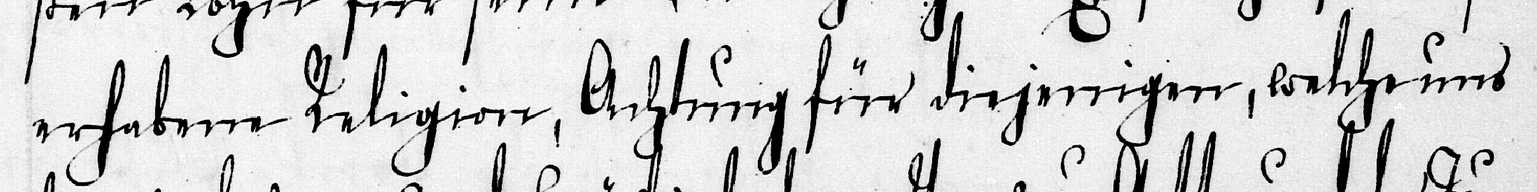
erhabene Religion, Achtung für diejenigen, welche uns
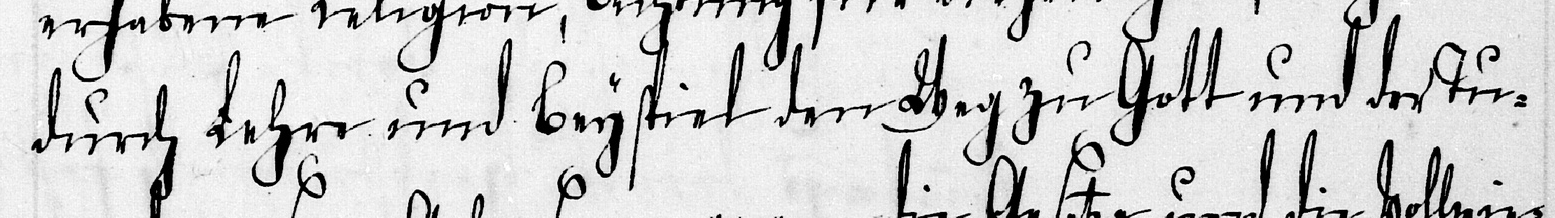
durch Lehre und Beyspiel den Weg zu Gott und der Tu¬
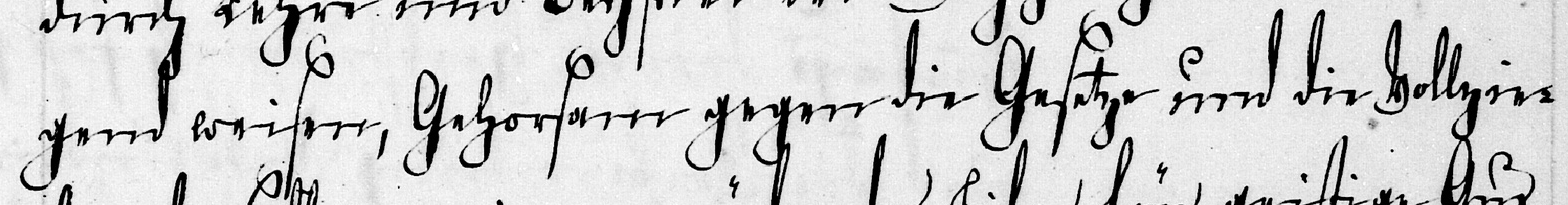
gend weisen, Gehorsam gegen die Gesetze und die Vollzie¬
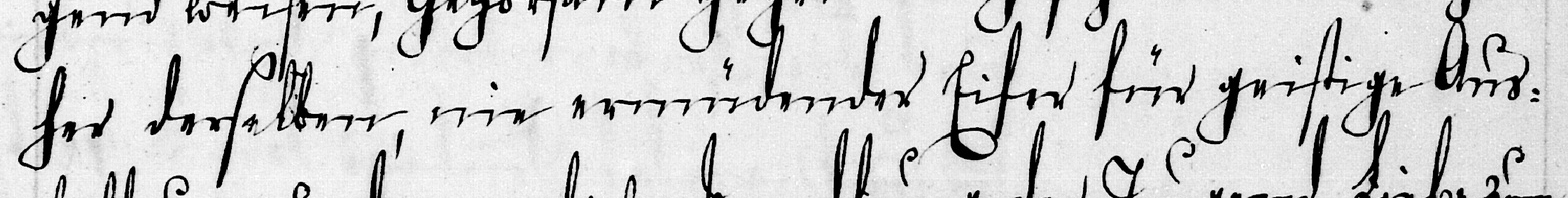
her derselben, nie ermüdender Eifer für geistige Aus¬
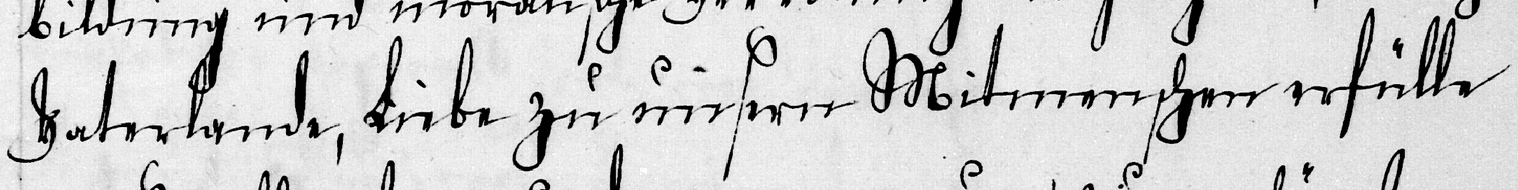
Vaterlande, Liebe zu unsern Mitmenschen erfülle
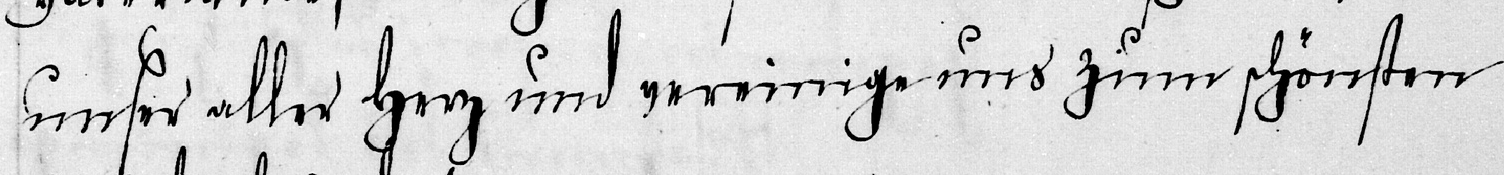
unser aller Herz und vereinige uns zum schönsten
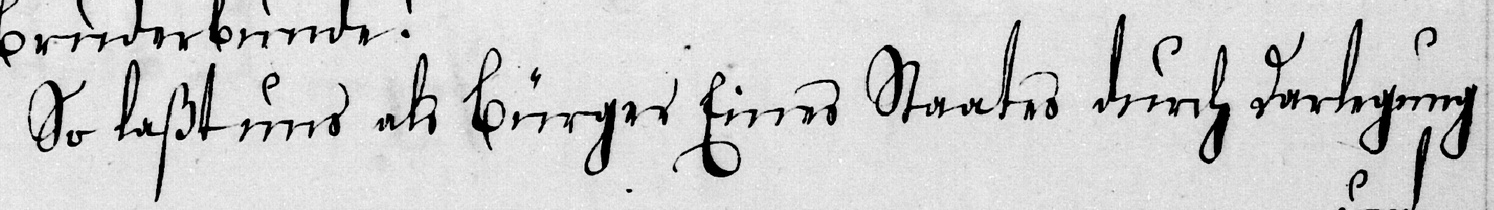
So laßt uns als Bürger Eines Staates durch Darlegung
